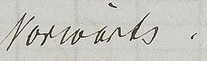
vorwärts.
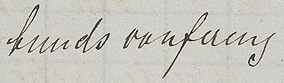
bundsconferenz
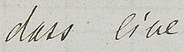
dass eine
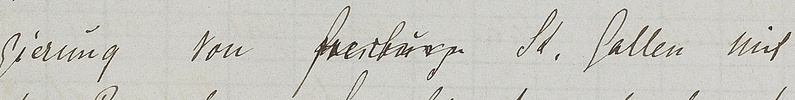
gierung von FreiburgSt. Gallen mit
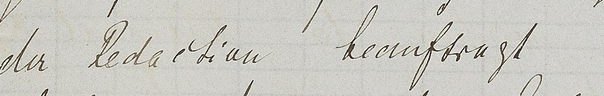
der Redaction beauftragt
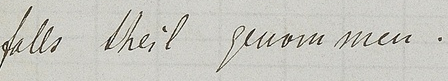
falls theil genommen.
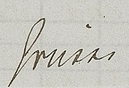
meine besten
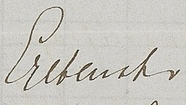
Erebenster
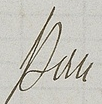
Bern
